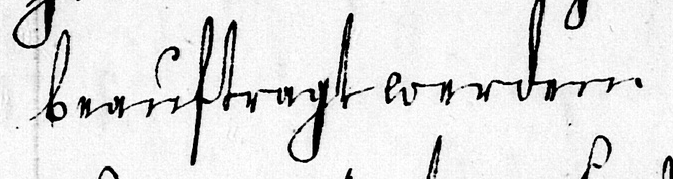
beauftragt werden.
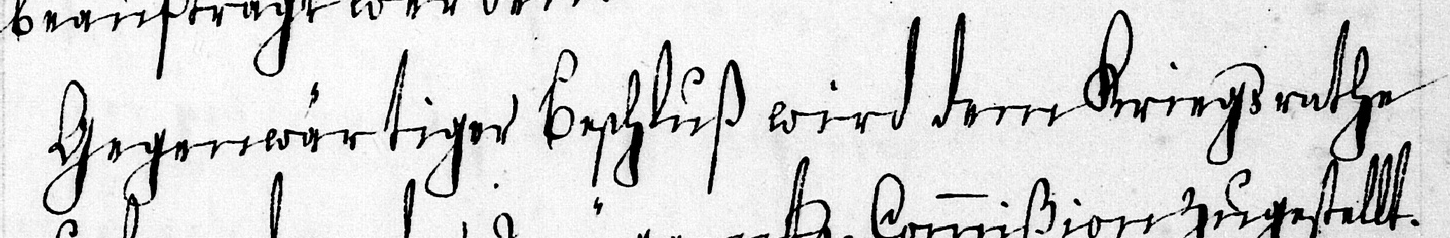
Gegenwärtiger Beschluß wird dem Kriegsrathe
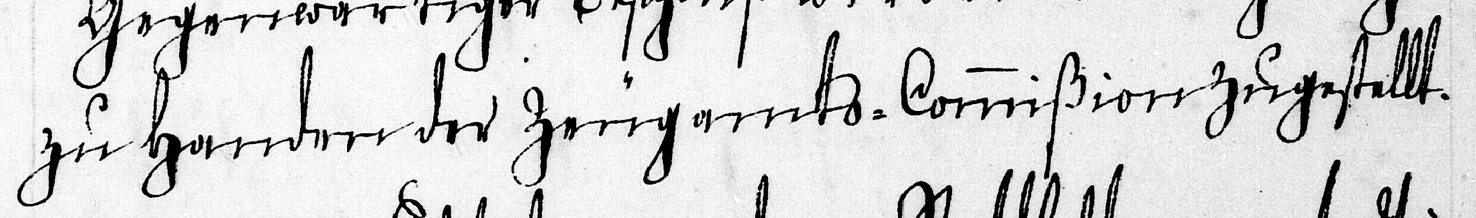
zu Handen der Zeugamts-Commißion zugestellt.
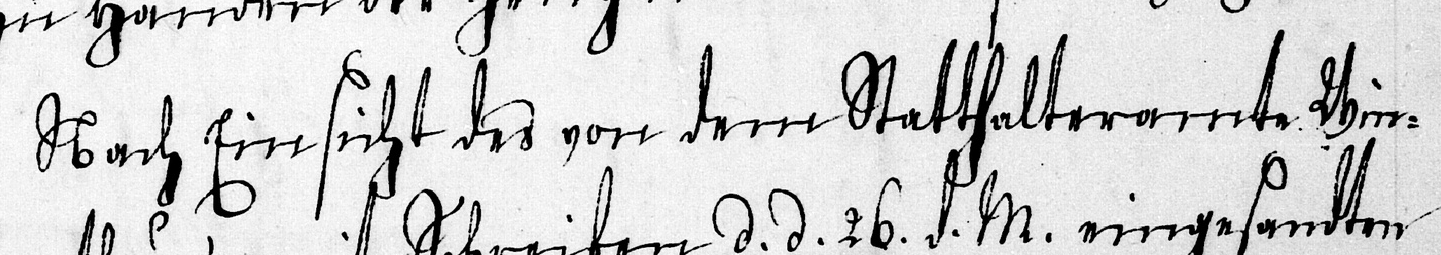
Nach Einsicht des von dem Statthalteramte Win¬
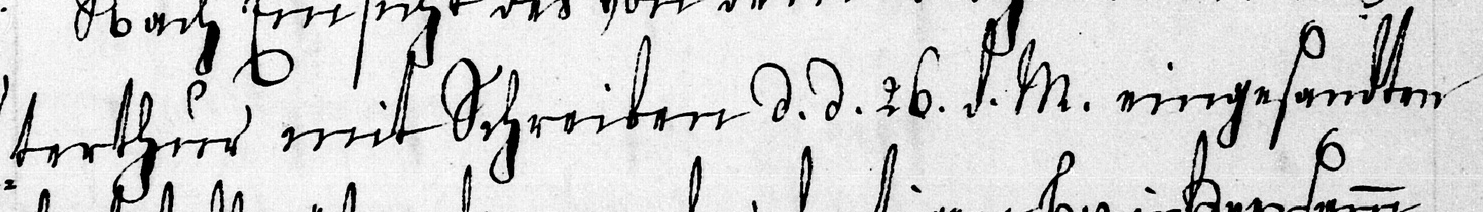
terthur mit Schreiben d. d. 26. d. M. eingesandten
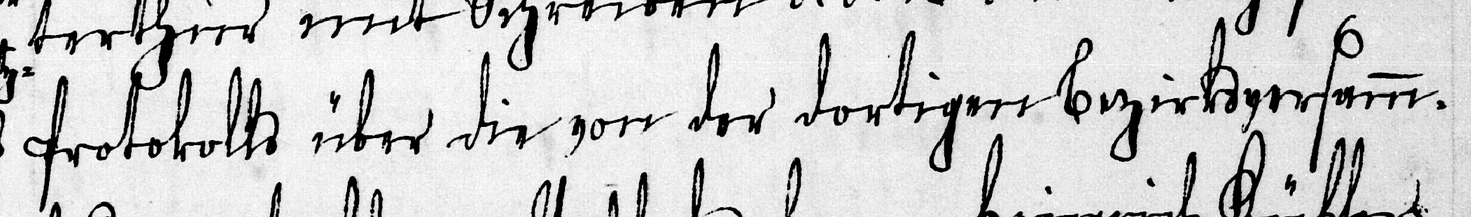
Protokolls über die von der dortigen Bezirksversamm¬
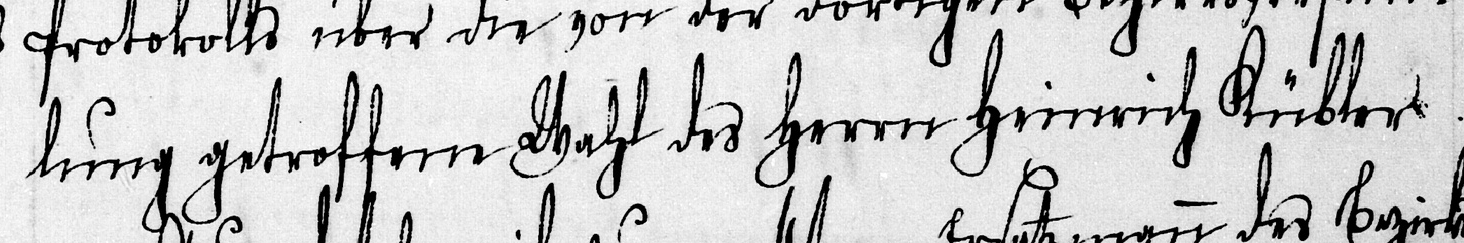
lung getroffene Wahl des Herrn Heinrich Kübler
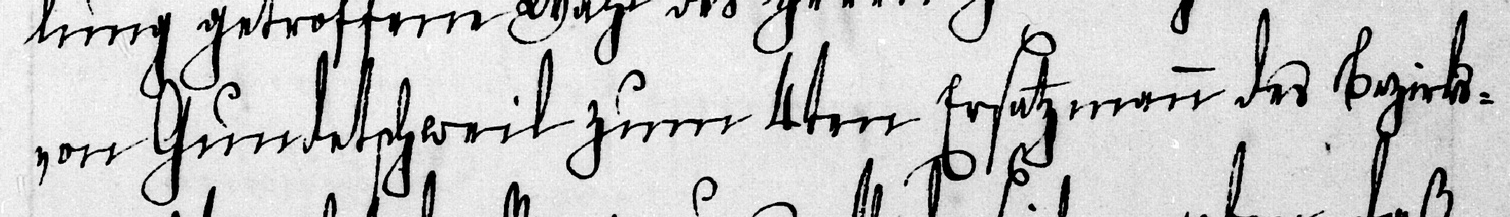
von Gundetschweil zum 4ten Ersatzmann des Bezirks¬
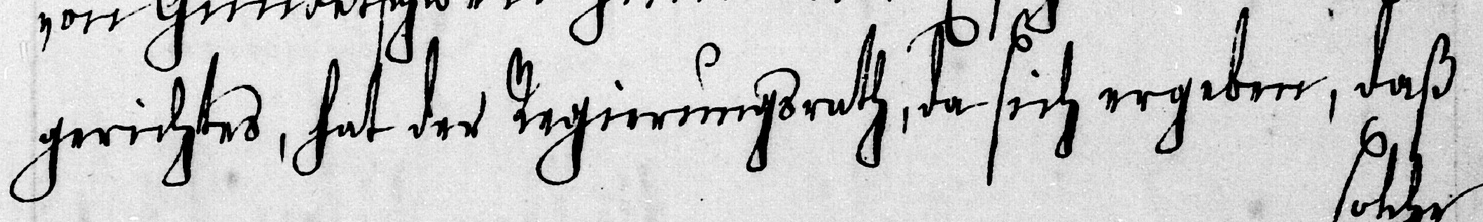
gerichtes, hat der Regierungsrath, da sich ergeben, daß
